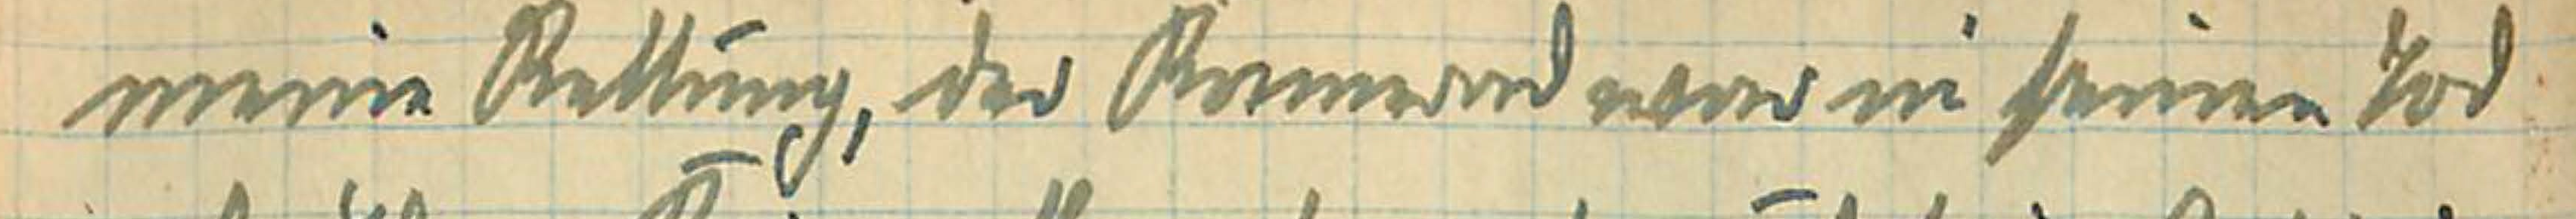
meine Rettung, der Kamerad war in seinen Tod
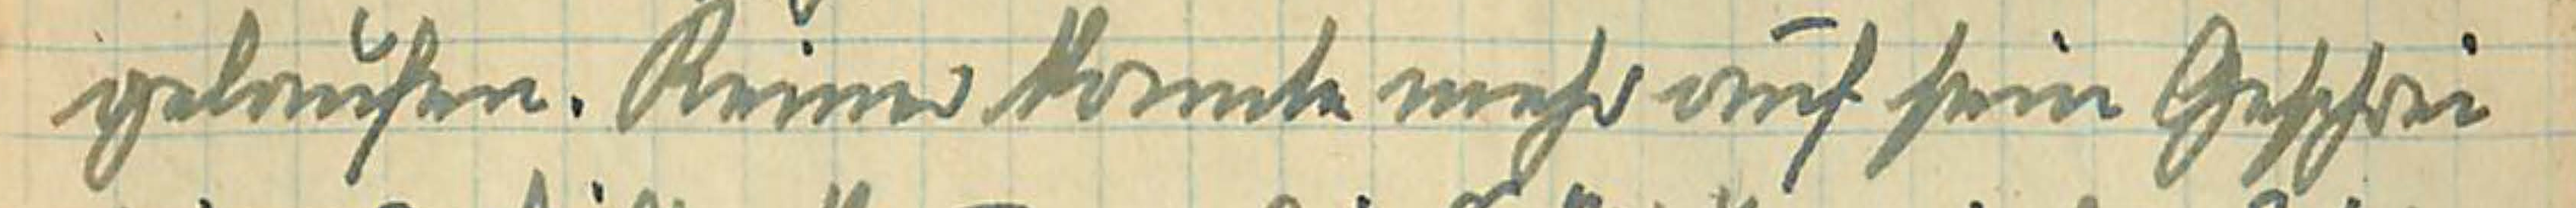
gelaufen. Keiner konnte mehr auf sein Geschrei
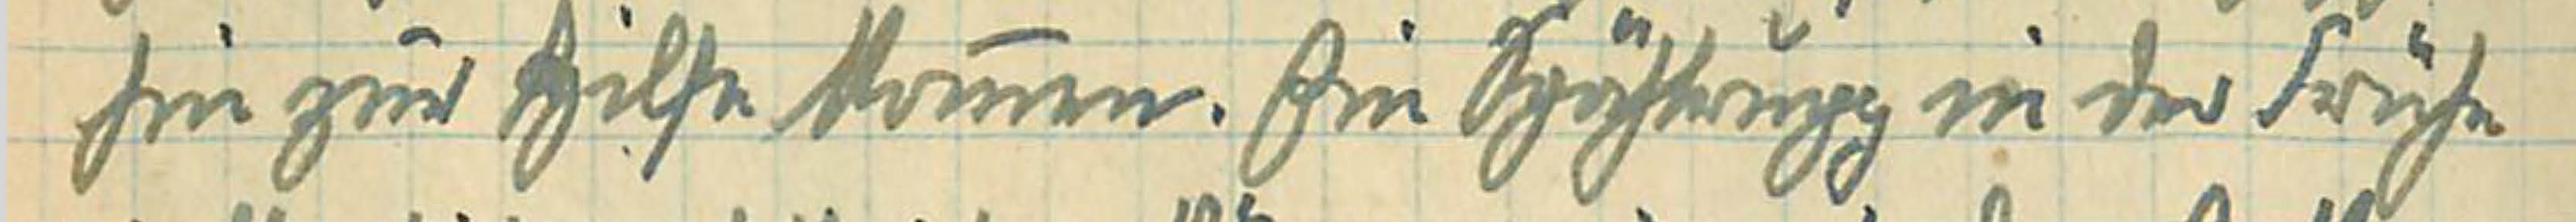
hin zur Hilfe kommen. Ein Spähtrupp in der Frühe
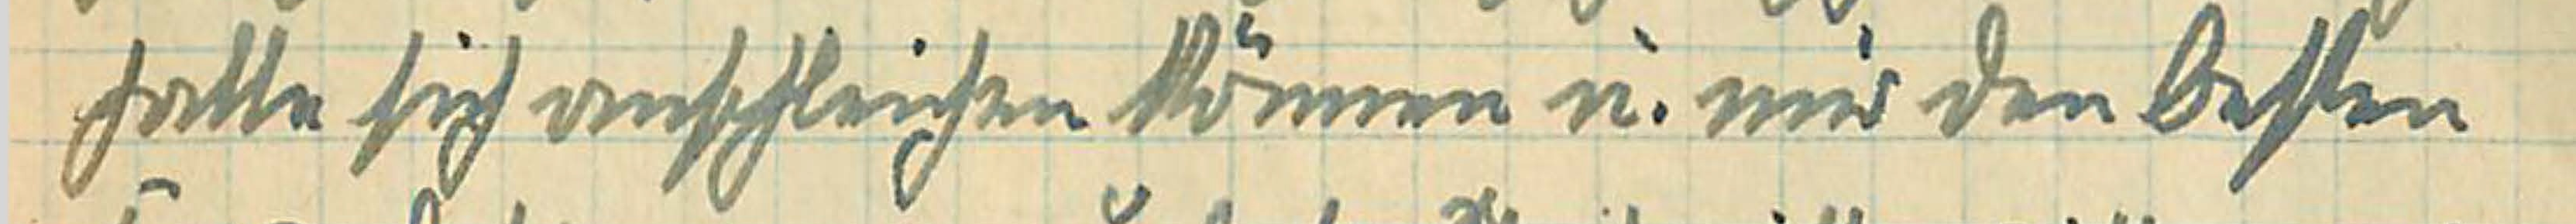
hatte sich anschleichen können u. mir den besten
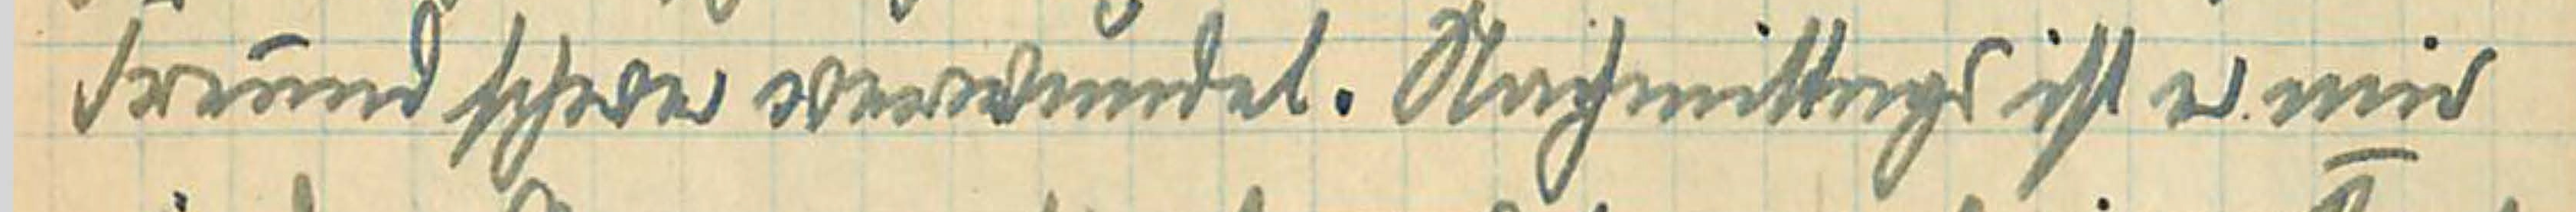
Freund schwer verwundet. Nachmittags ist er mir
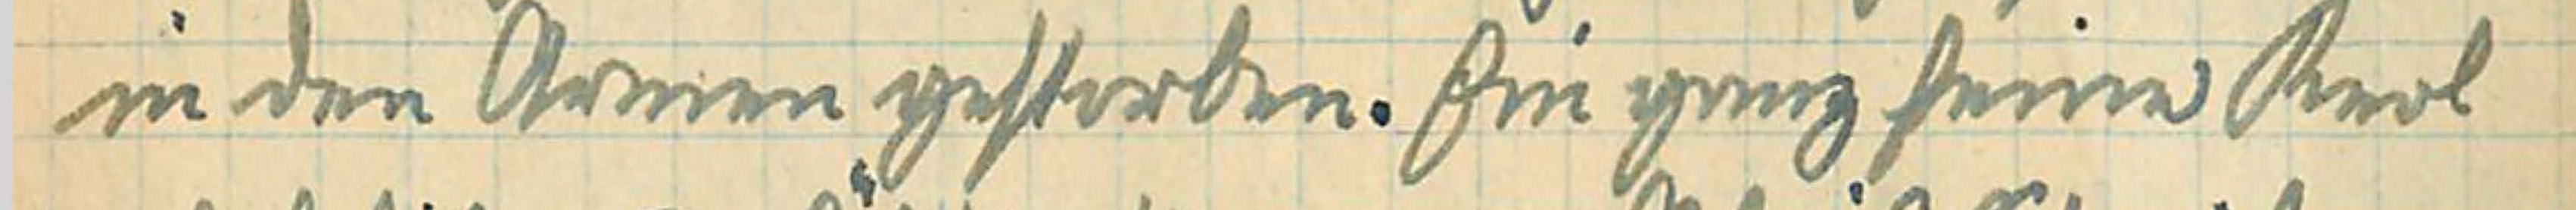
in den Armen gestorben. Ein ganz feiner Kerl
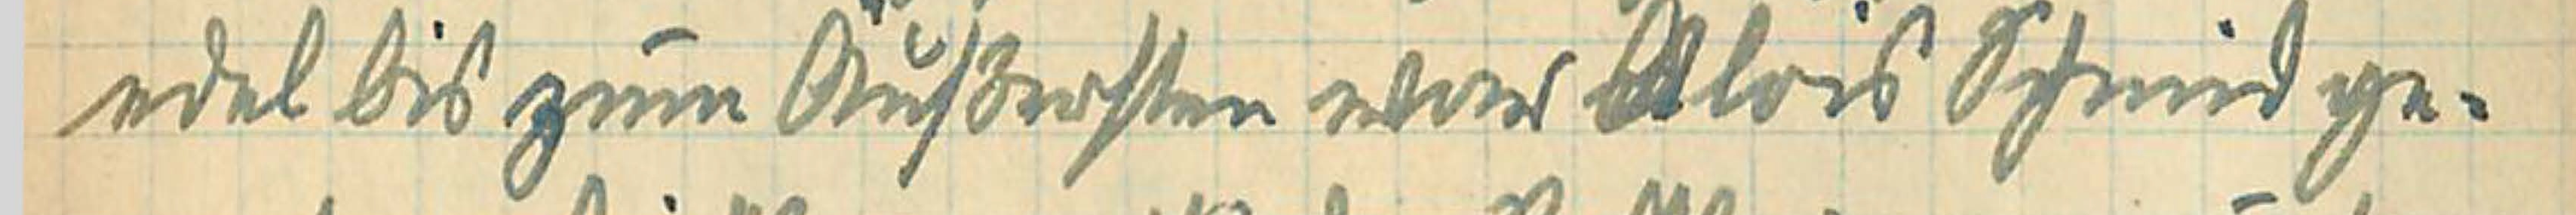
edel bis zum Äußersten war Alois Schmid ge-
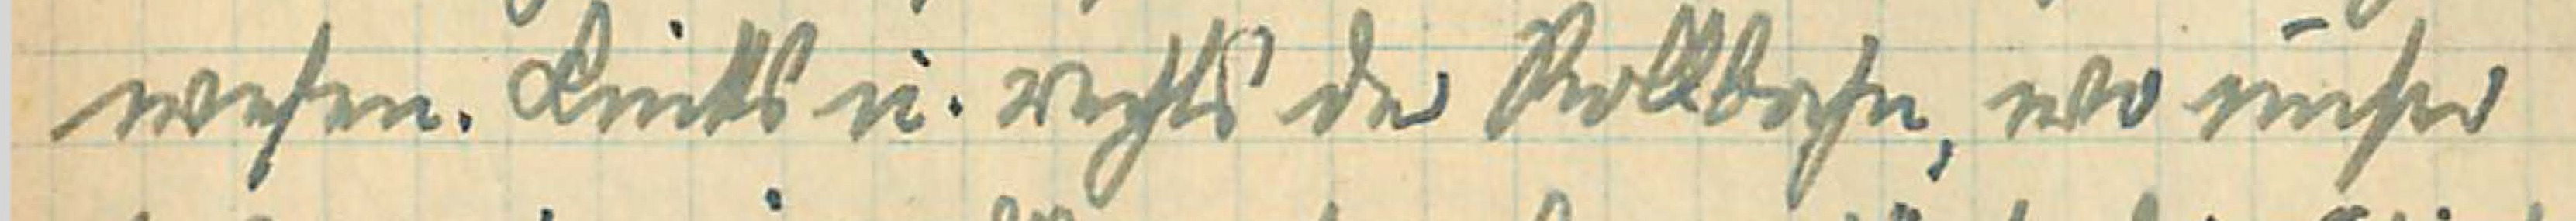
wesen. Links u. rechts der Rollbahn, wo unser
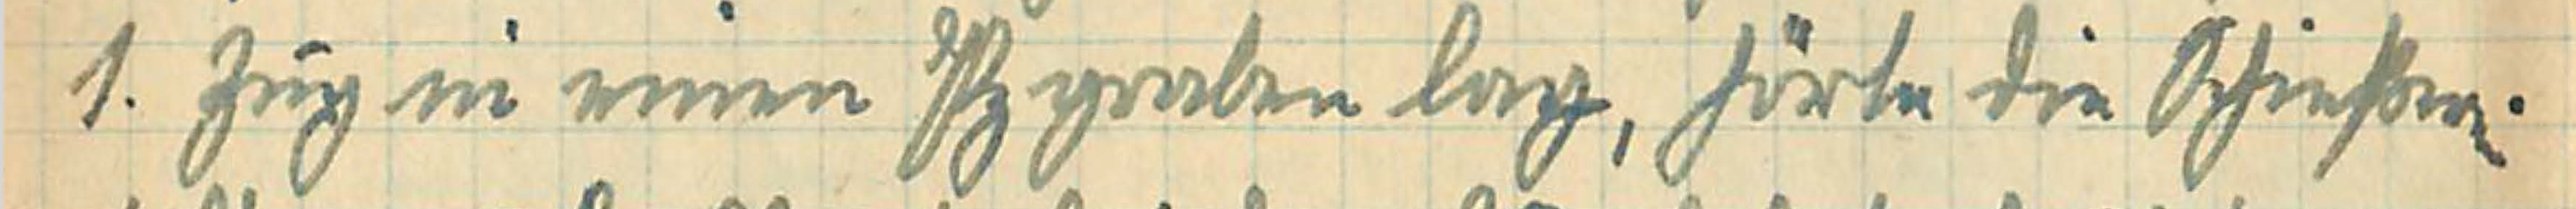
1. Zug in einem Pzgraben lag, hörte die Schießerei
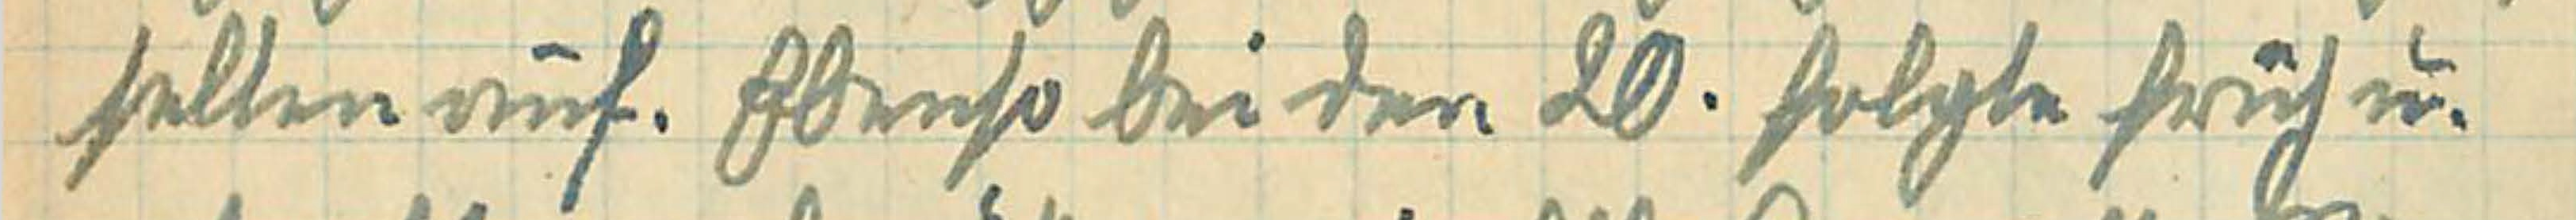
selten auf. Ebenso bei den 20. folgte früh u.
